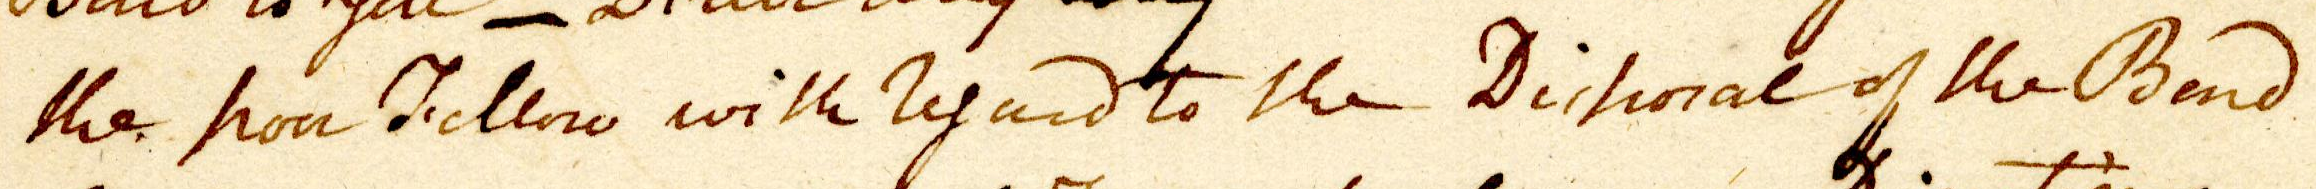the poor Fellow with regard to the Disposal of the Bond
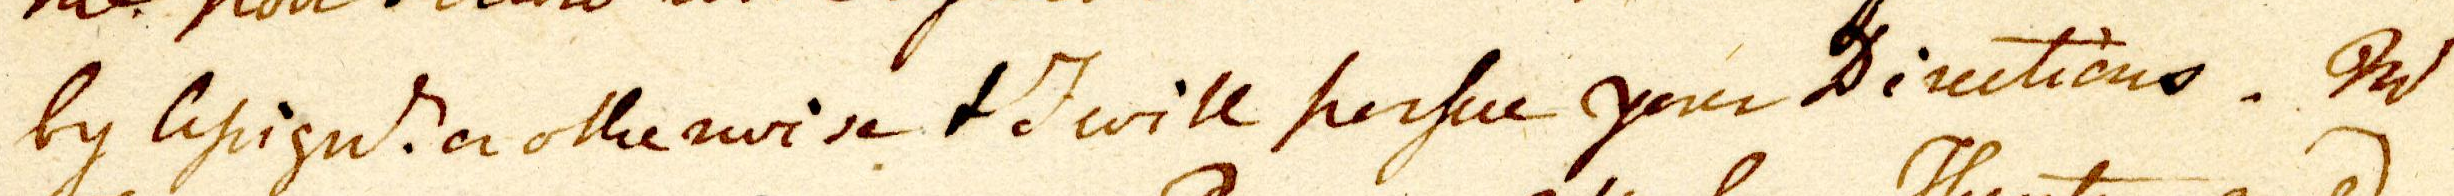by Assign^t. otherwise & I will persue your Directions. M^r
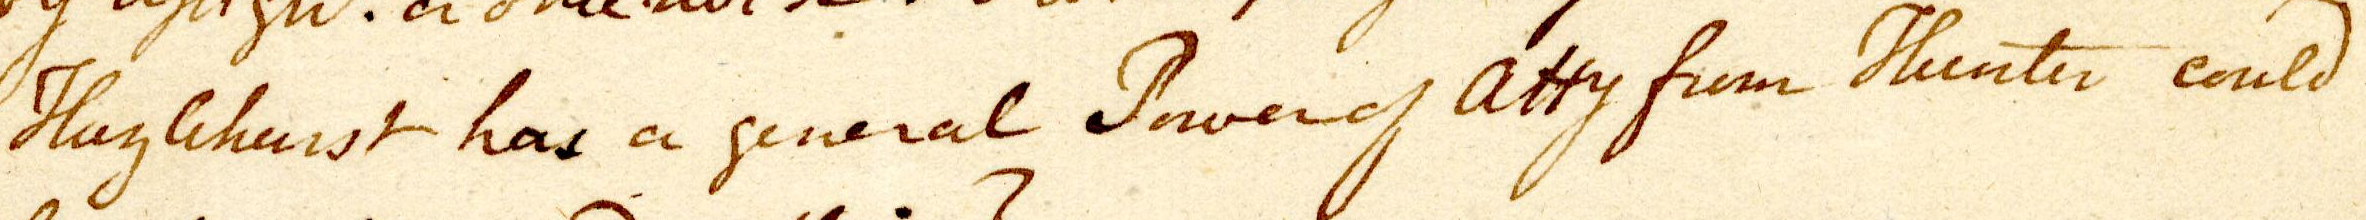Hazlehurst has a general Power of Atty from Hunter could
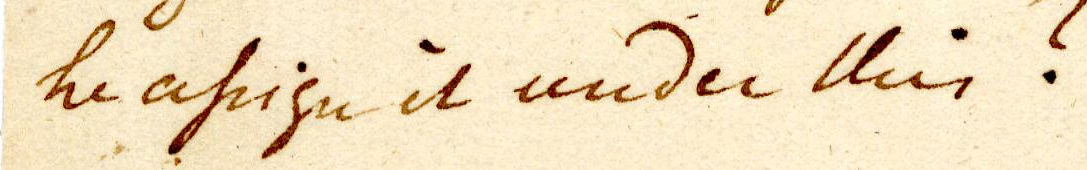he assign it under this?
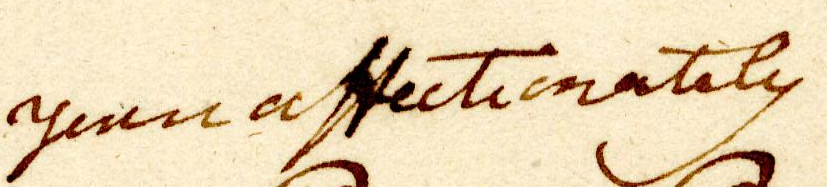Yours affectionately
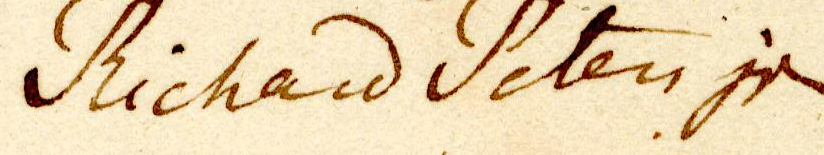Richard Peters jr
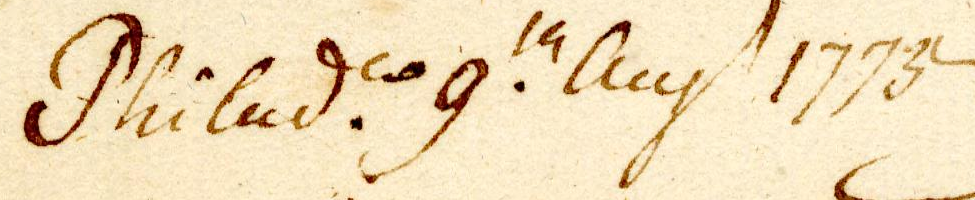Philad^a. 9^th Aug^t 1773
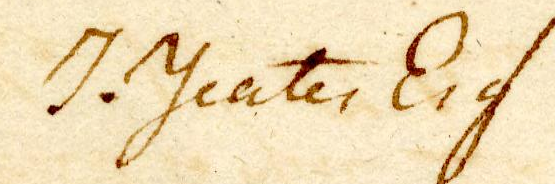J. Yeates Esq
